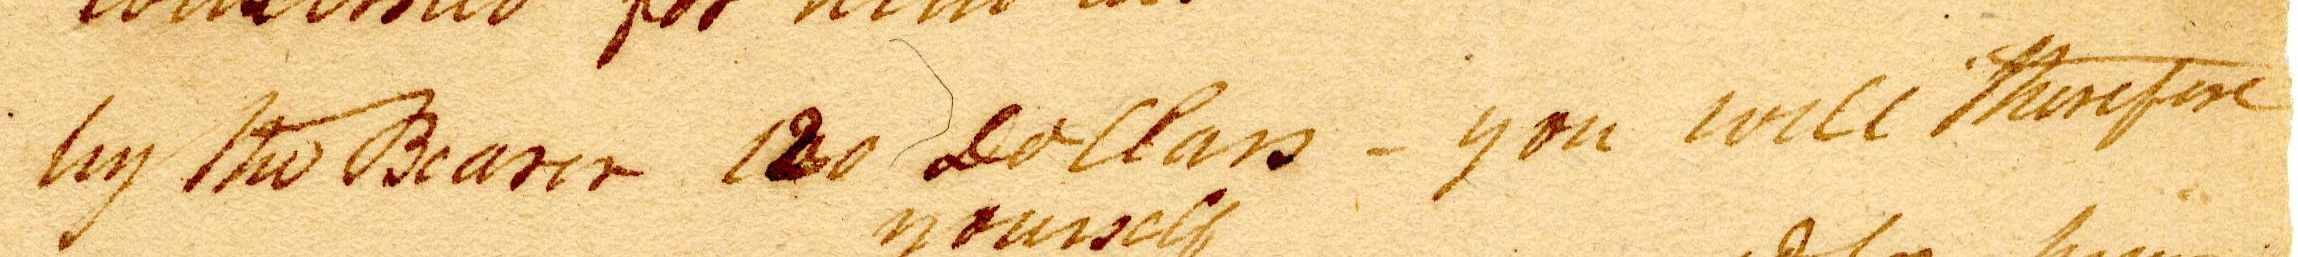by the Bearer 120 Dollars. you will therefore
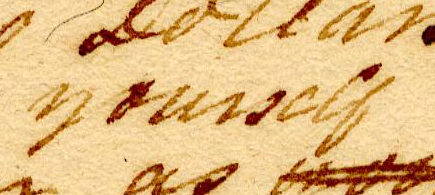yourself
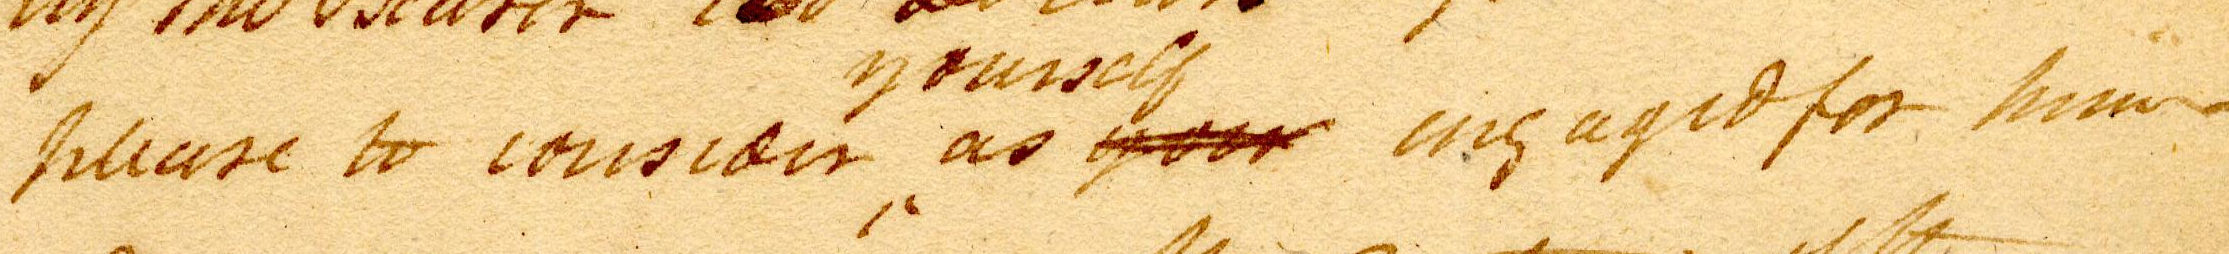plase to consider ^ as your ingaged for him
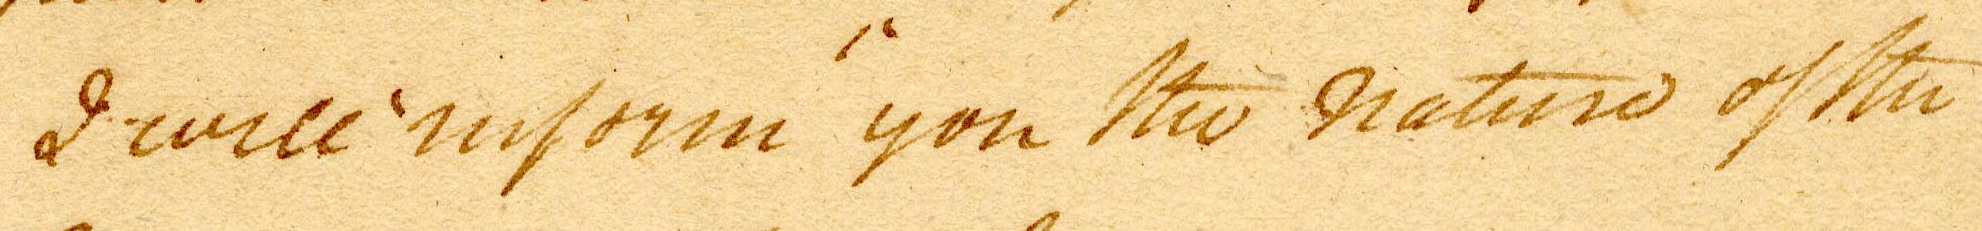I will inform you the Nature of the
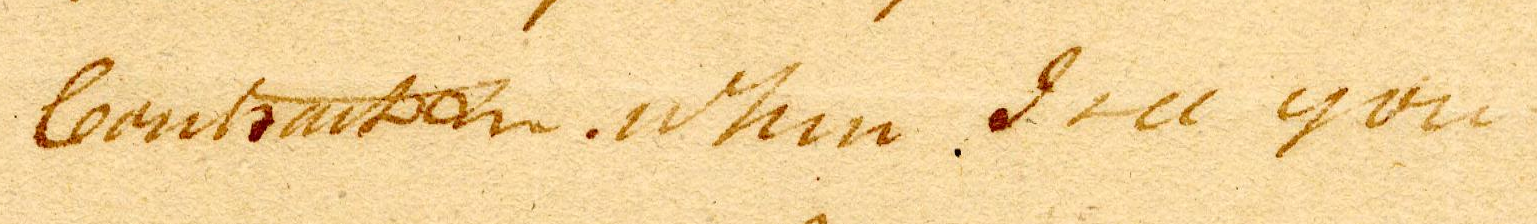Contracts when I see you
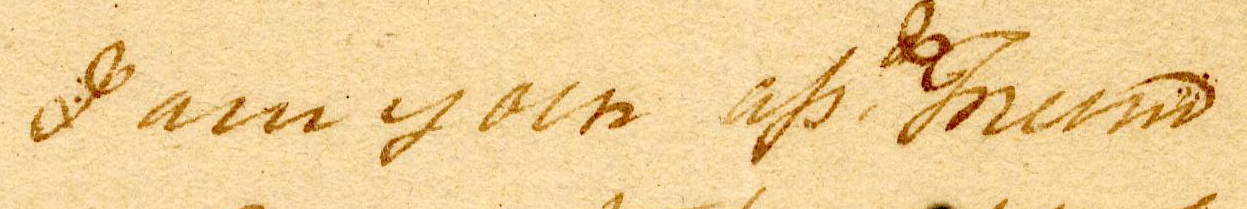I am your as^d Friend
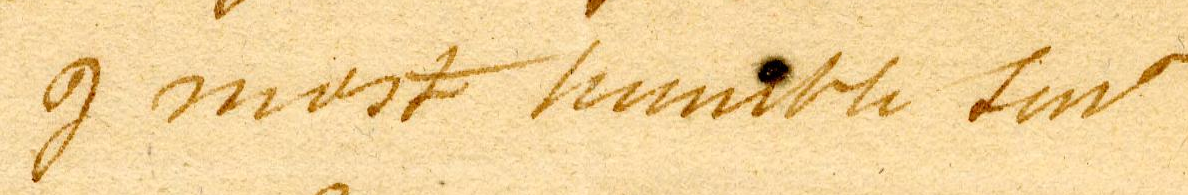& most humble Serv^t
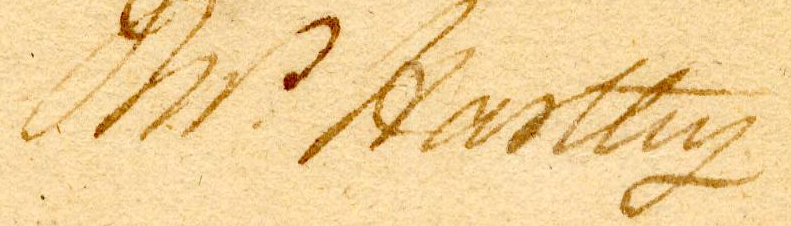Tho. Hartley
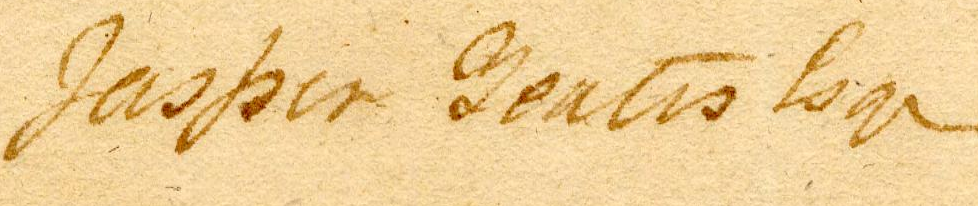Jasper Yeates Esq^r
